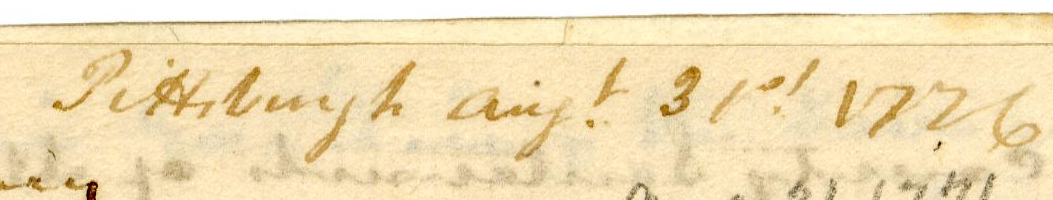Pittsburgh Aug^t. 31^st. 1776
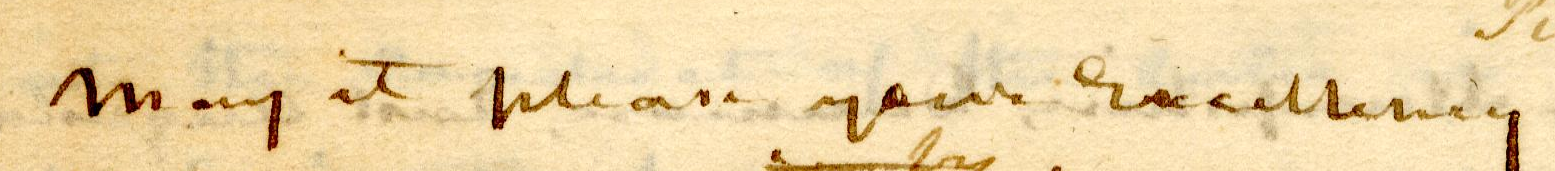May it please your Excellency
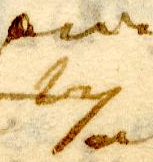by
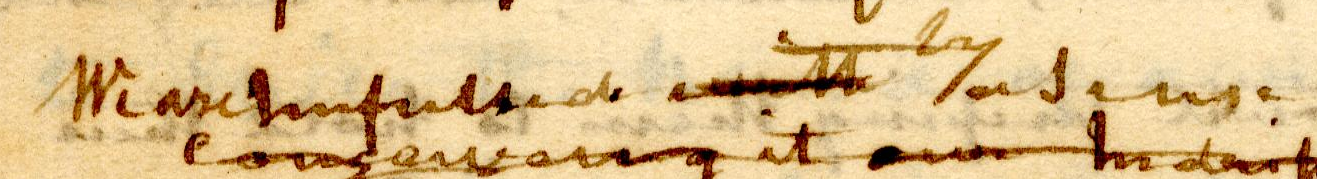We are informed [with] a Savage
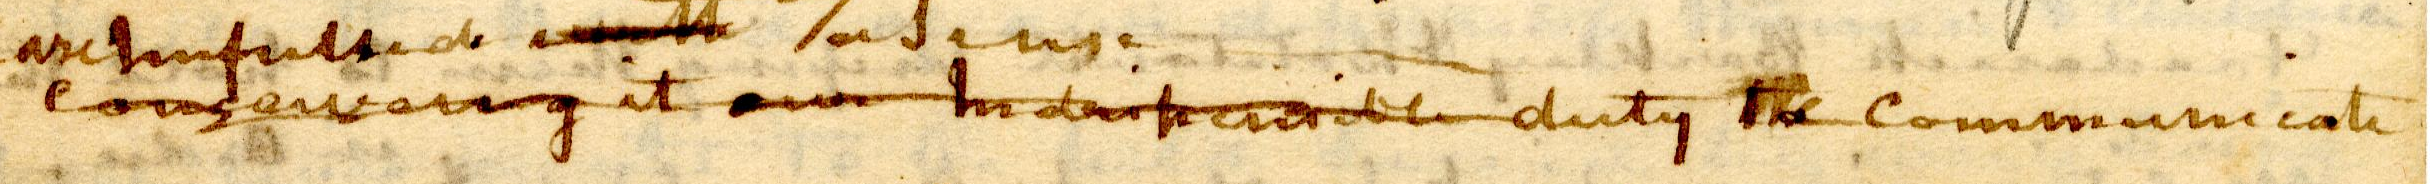[Concerning it our Indispensible] duty to Communicate
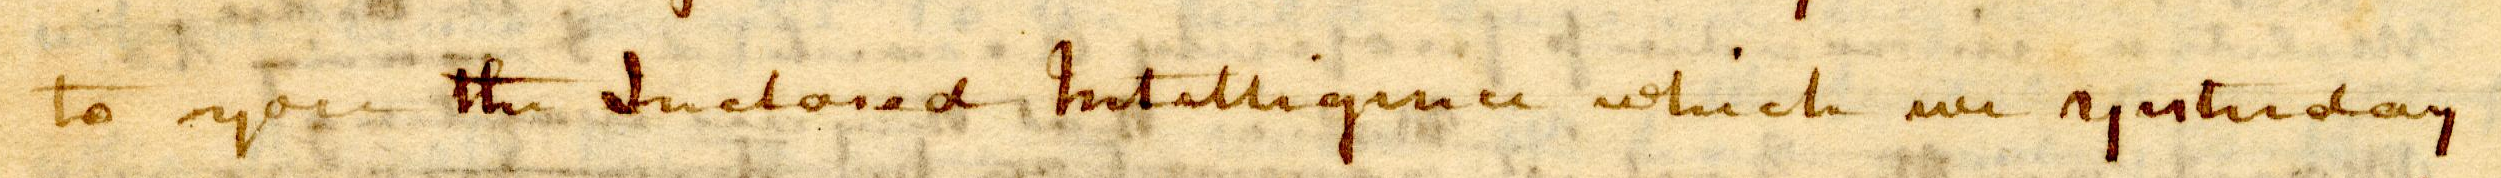to you the Inclosed Intelligence which we yesterday
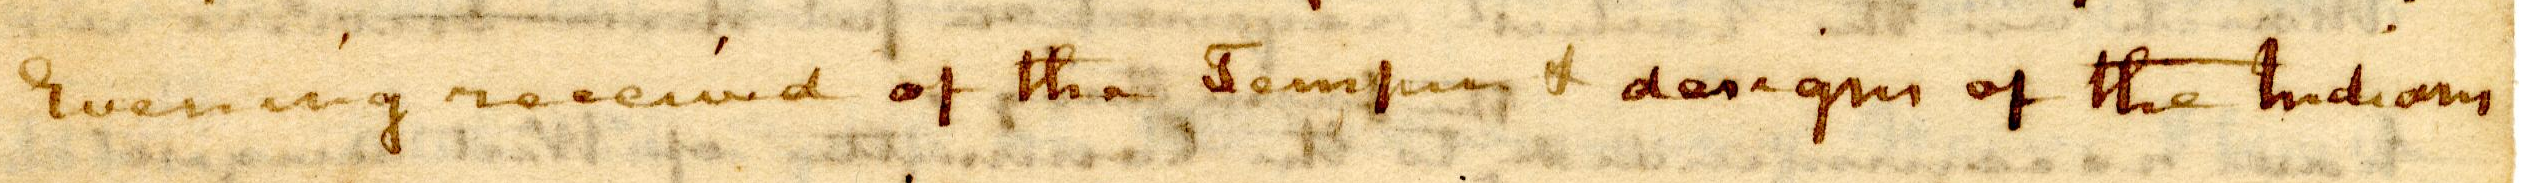Evening received of the Temper & design of the Indians
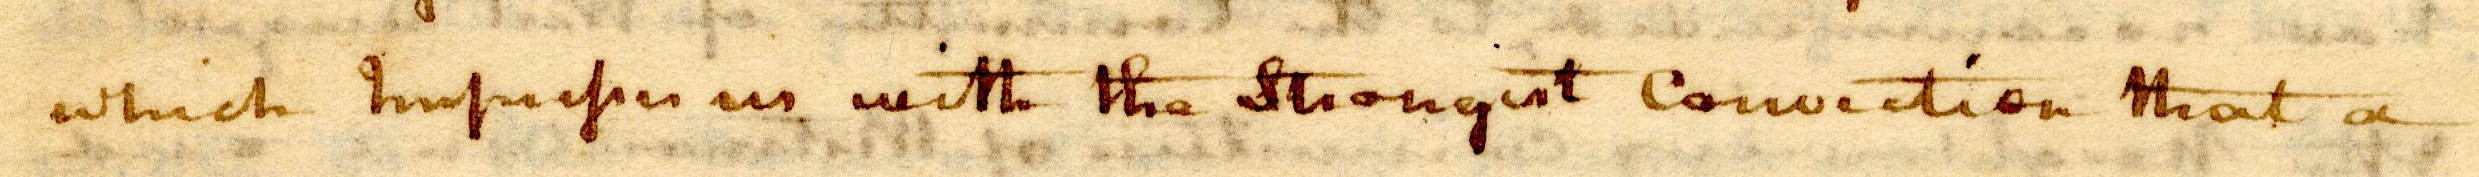which Imposes us with the Strongest Conviction that a
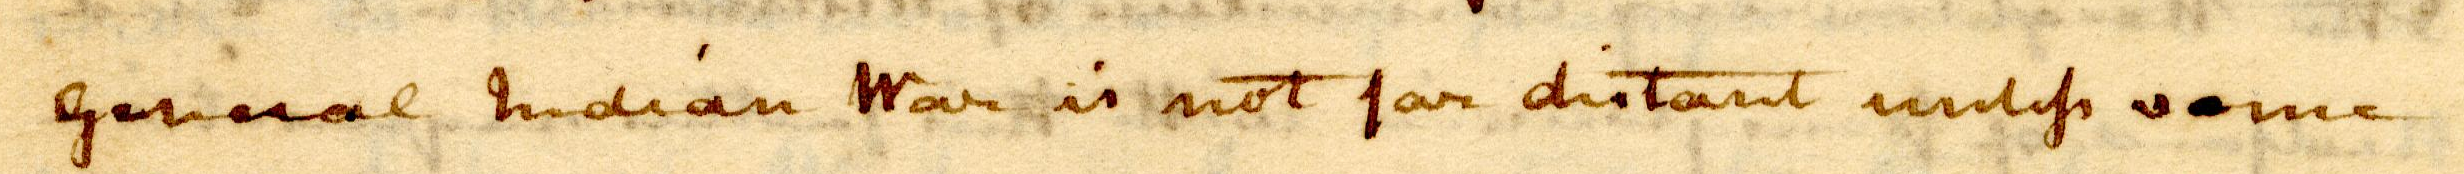General Indian War is not far distant unless some
